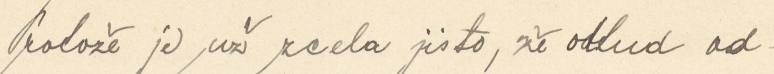Protože je už zcela jisto, že odtud od-
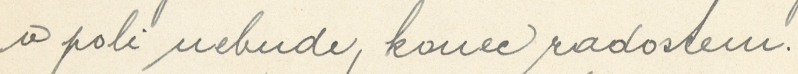v poli nebude, konec radostem.
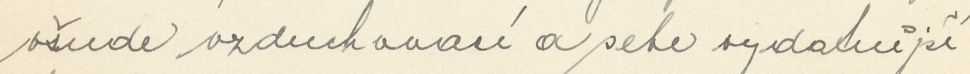všude vzduchovací a sebe vydatnější
